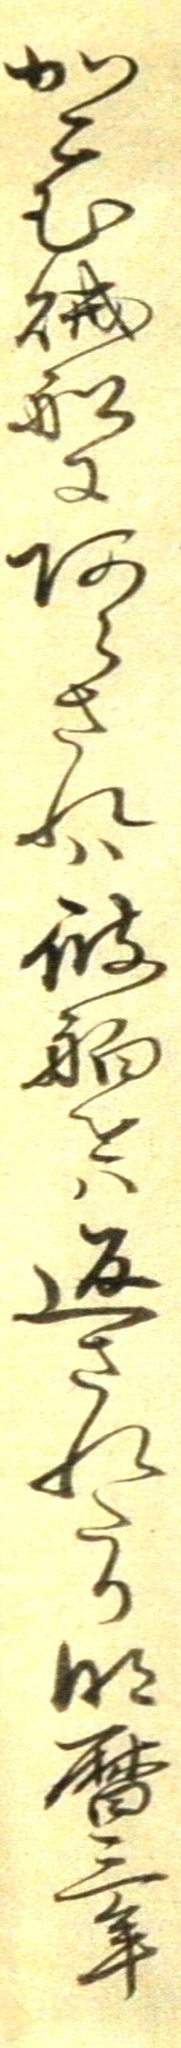かこむ賊船にあらされは彼舶をは返されたり明暦三年

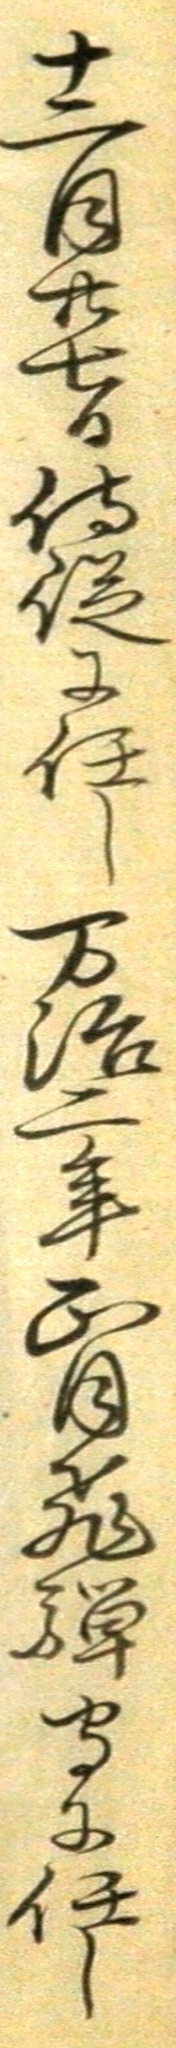十二月廿七日侍従に任し万治二年正月飛騨守に任し
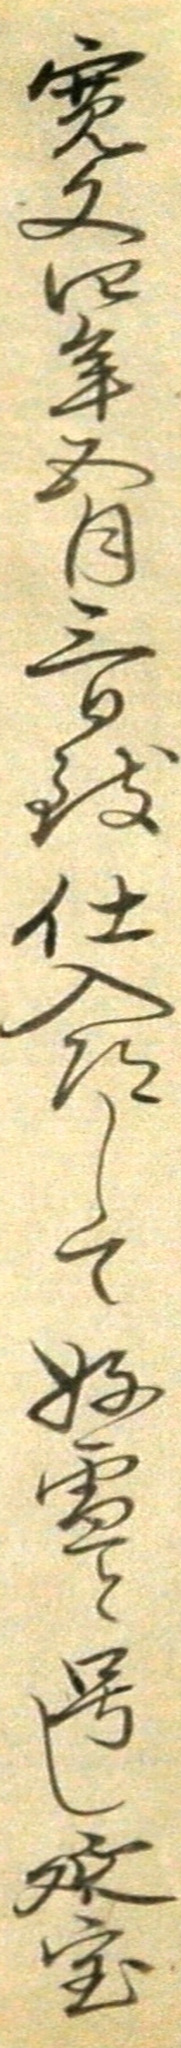寛文四年五月三日致仕入道して好雪と号し延宝
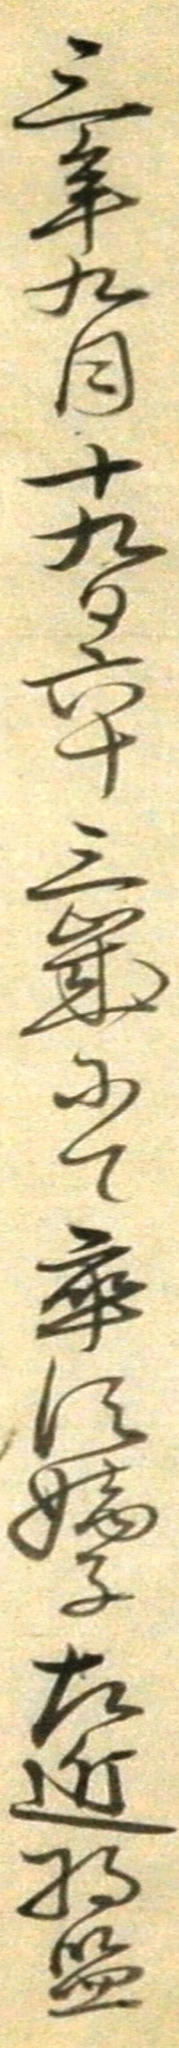三年九月十九日六十三歳にて卒す嫡子左近将監
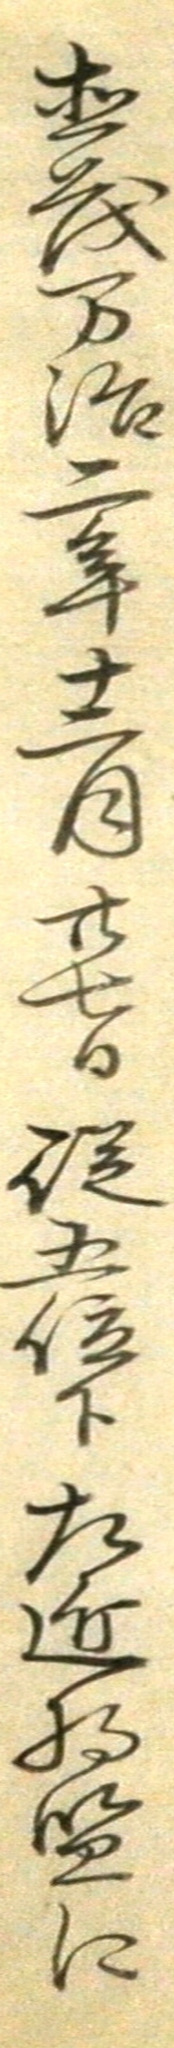直茂万治二年十二月廿七日従五位下左近将監に
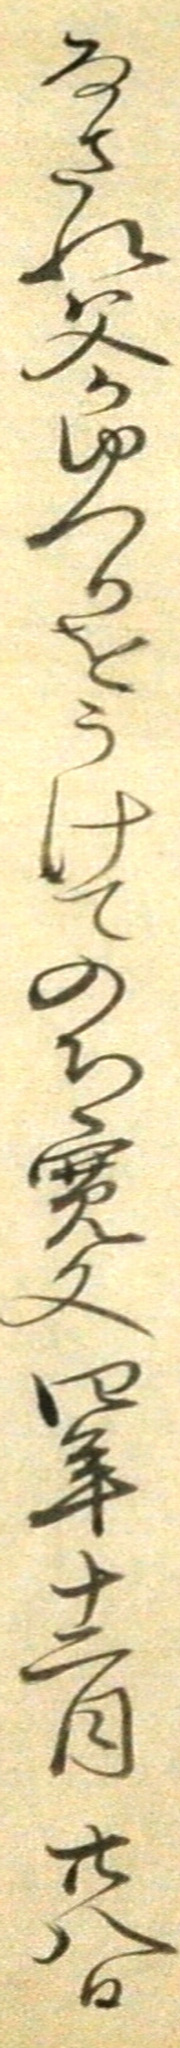なされ父かゆつりをうけてのち寛文四年十二月廿八日
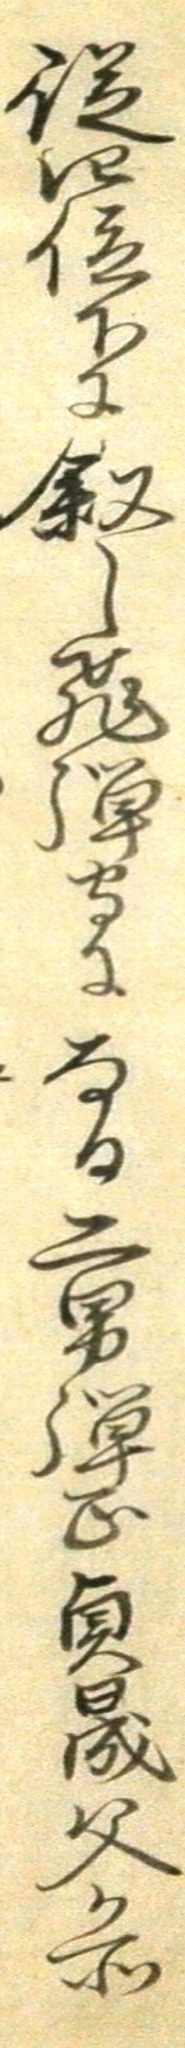従四位下に叙し飛騨守になる二男弾正貞晟父か所
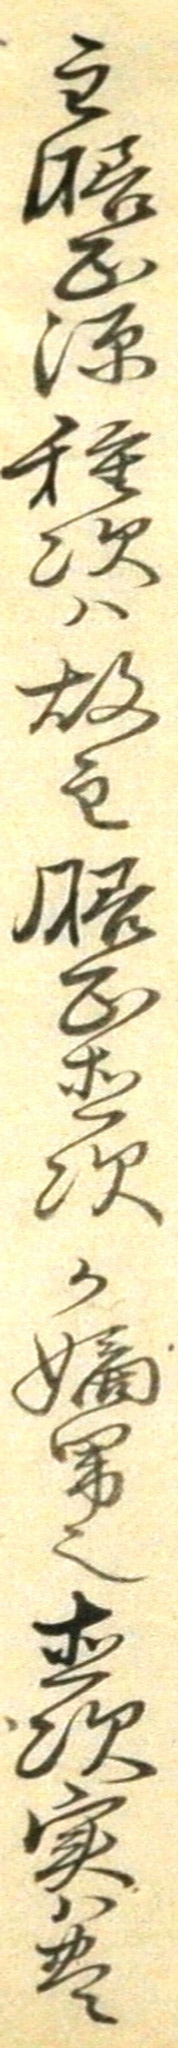主膳正源種次は故主膳正直次か嫡男也直次実は豊
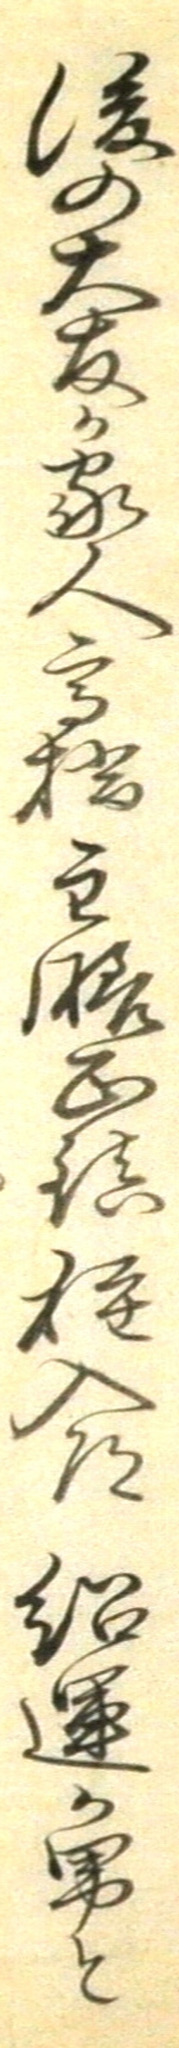後の大友か家人高橋主膳正鎮種入道紹運か男と
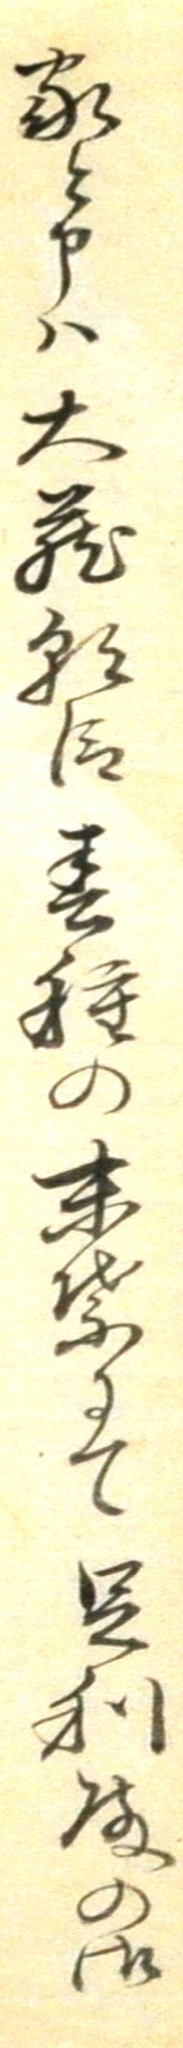家と申は大蔵朝臣春種の末葉にて足利殿の御
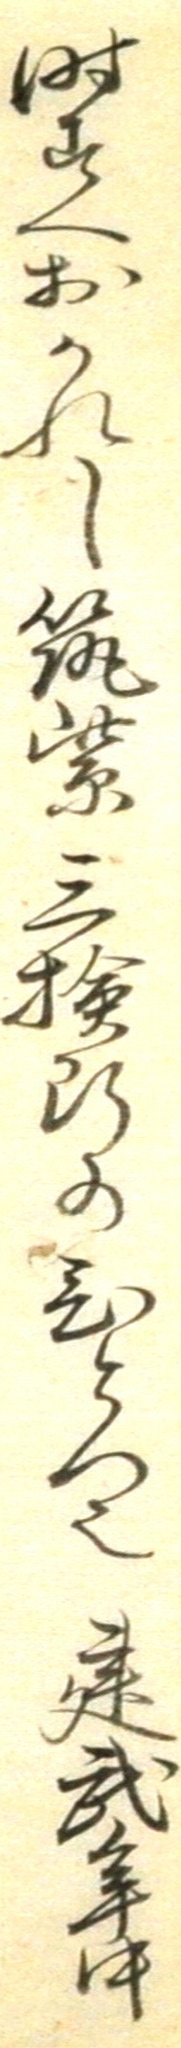時すへおかれし筑紫三検断のひとつ也建武年中
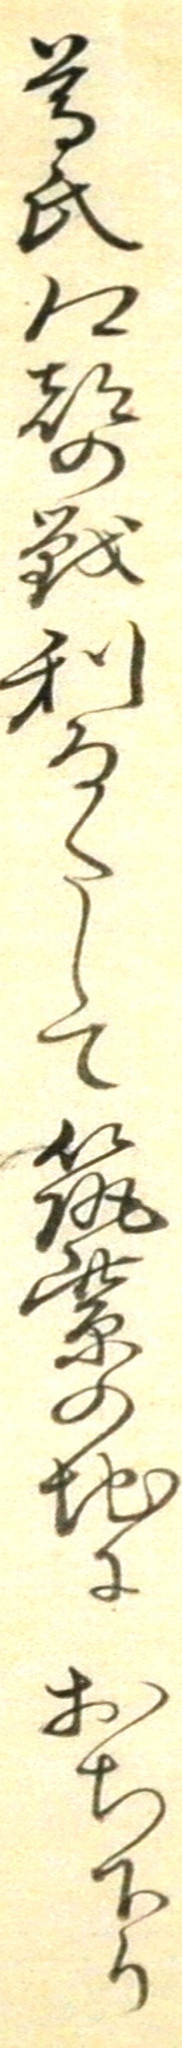尊氏卿都の戦利なくして筑紫の地におち下り
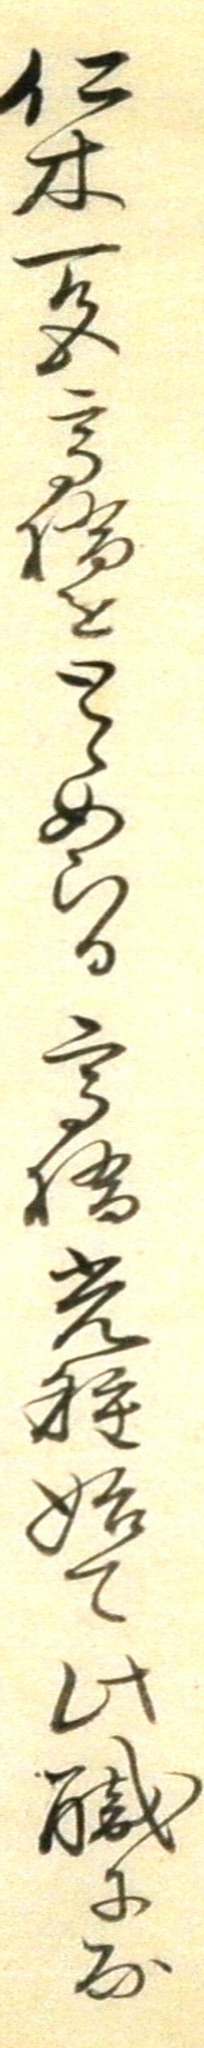仁木一色高橋をとゝめらる高橋光種始て此職にな
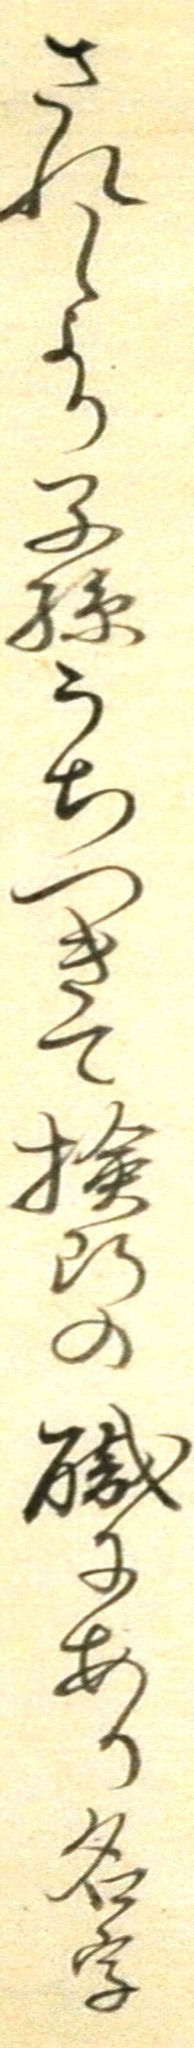されしより子孫うちつきて検断の職にあり名字
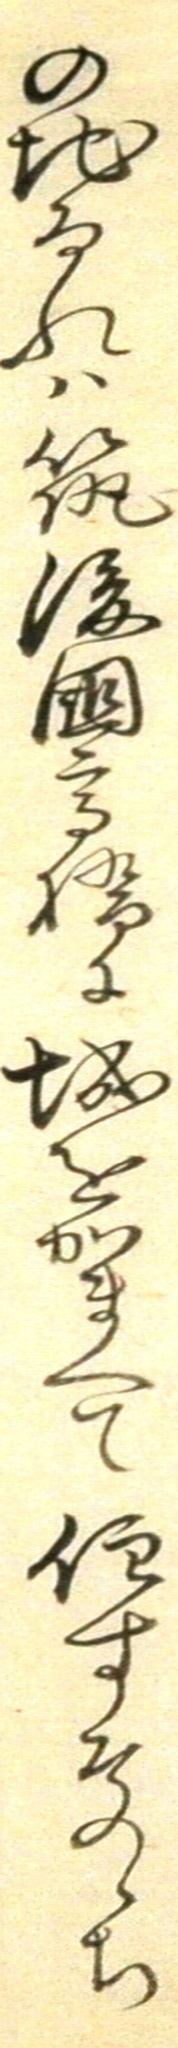の地なれは筑後国高橋に城をかまへて住すそのゝち
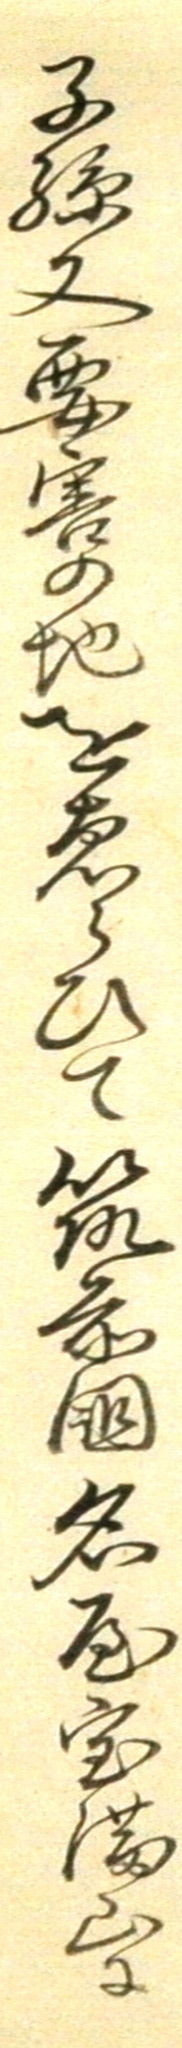子孫又要害の地をゑらひて筑前国名屋宝満山に
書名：藩翰譜（八・下）
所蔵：伊那市立高遠町図書館・合同会社AMANE
